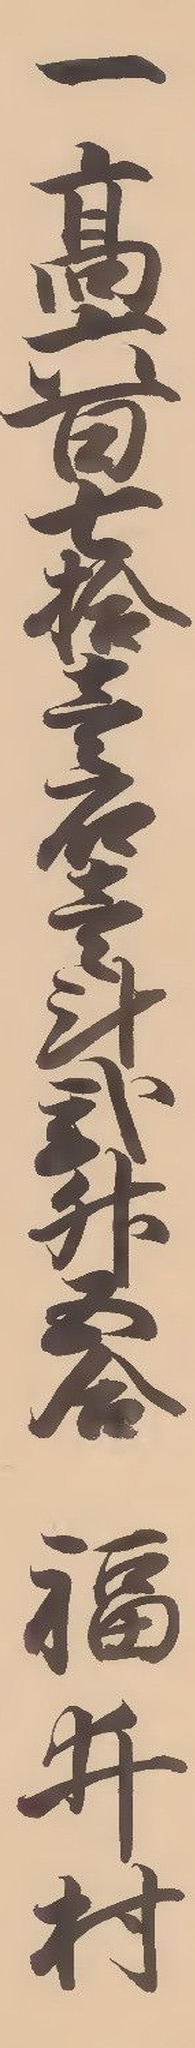一高六百七拾壱石壱斗弐升五合福井村
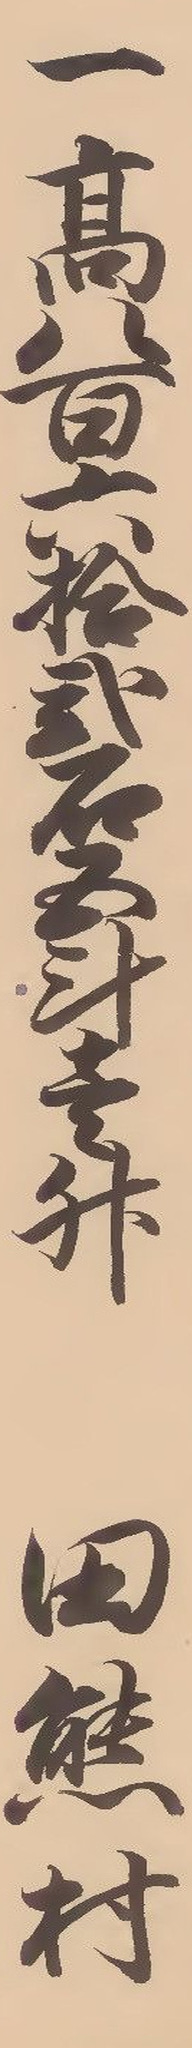一高八百六拾弐石五斗壱升田熊村

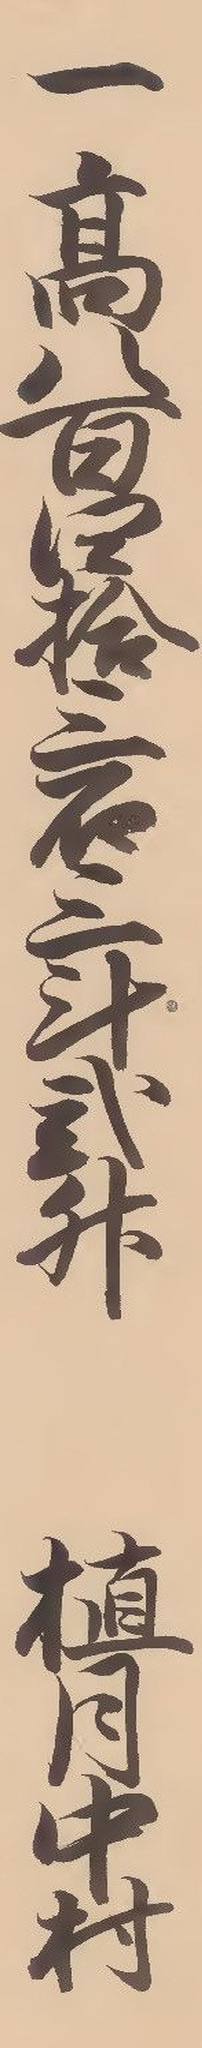一高八百四拾三石三斗弐升植月中村
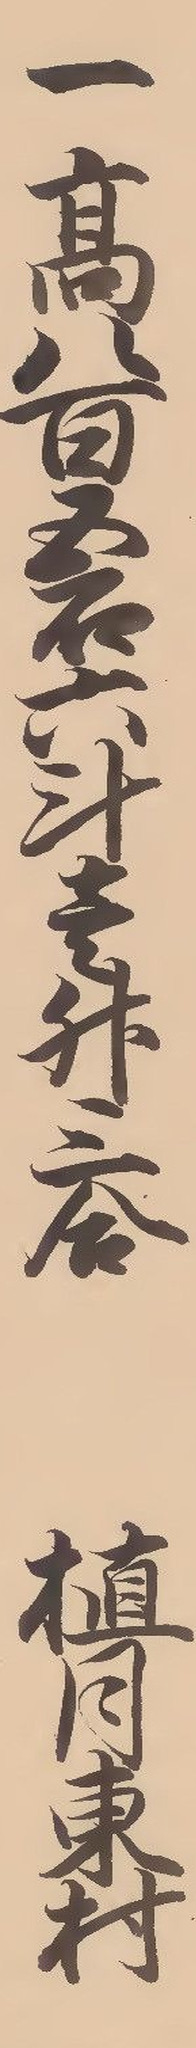一高八百五石六斗壱升三合植月東村
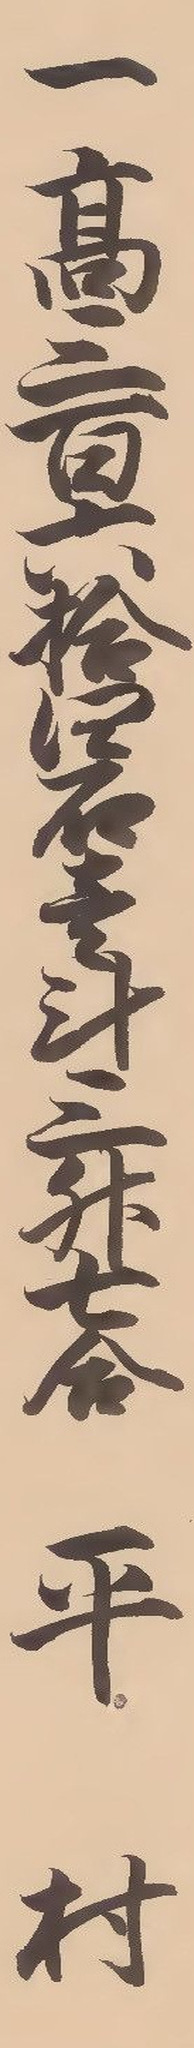一高三百六拾四石壱斗三升七合平村
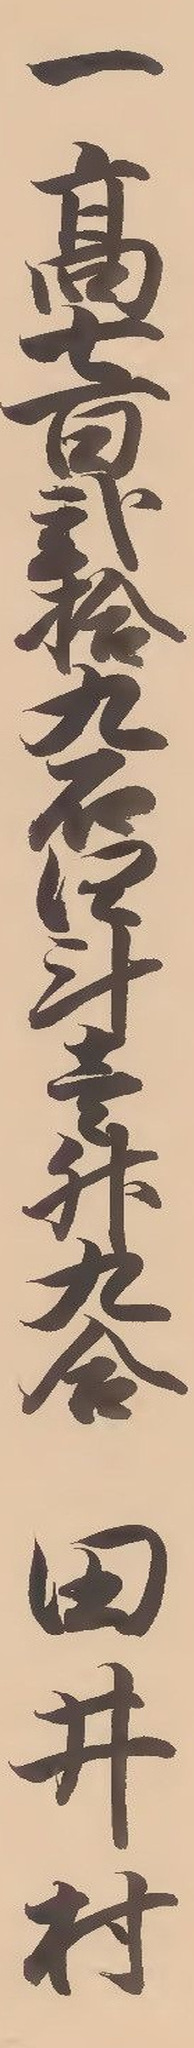一高七百弐拾九石四斗壱升九合田井村
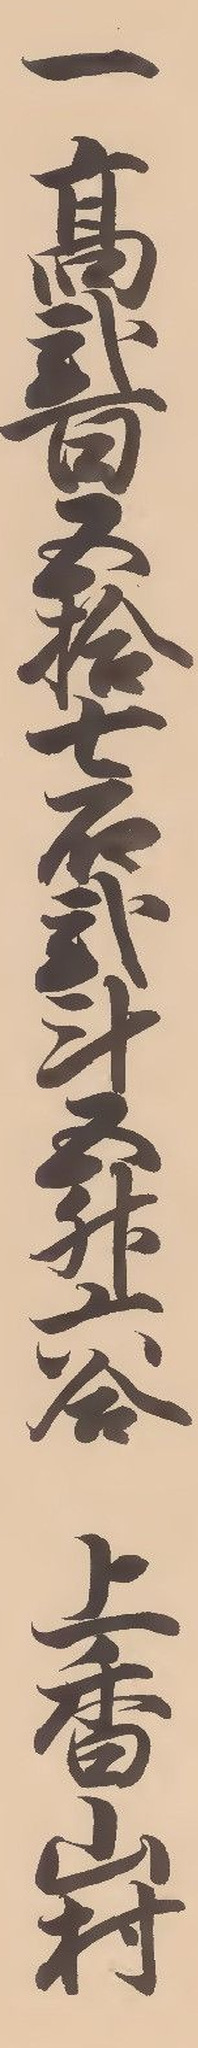一高弐百五拾七石弐斗五升六合上香山村
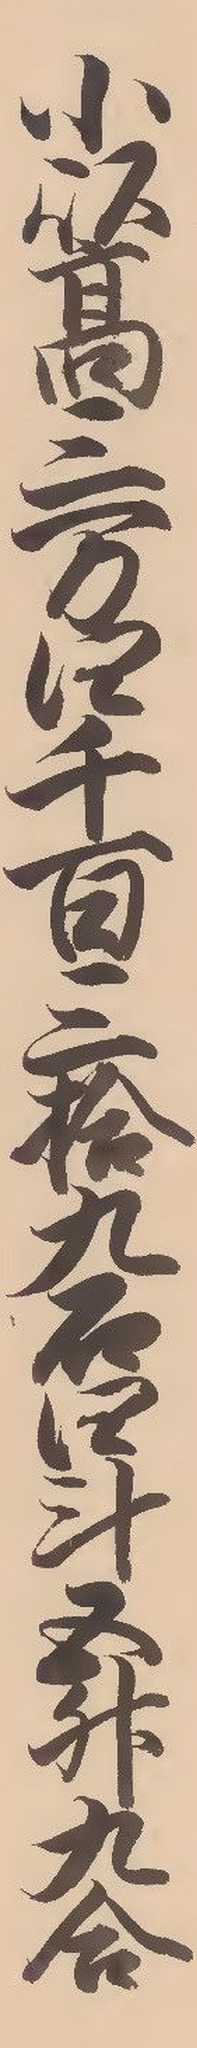小以高三万四千百三拾九石四斗五升九合

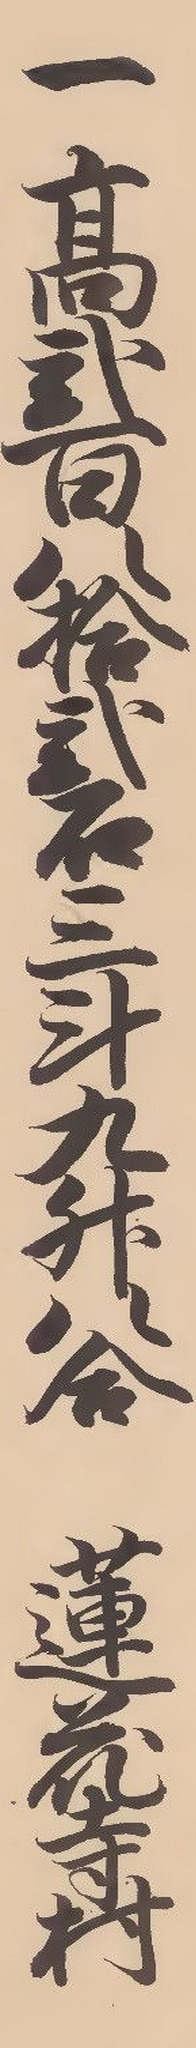一高弐百八拾弐石三斗九升八合蓮花寺村
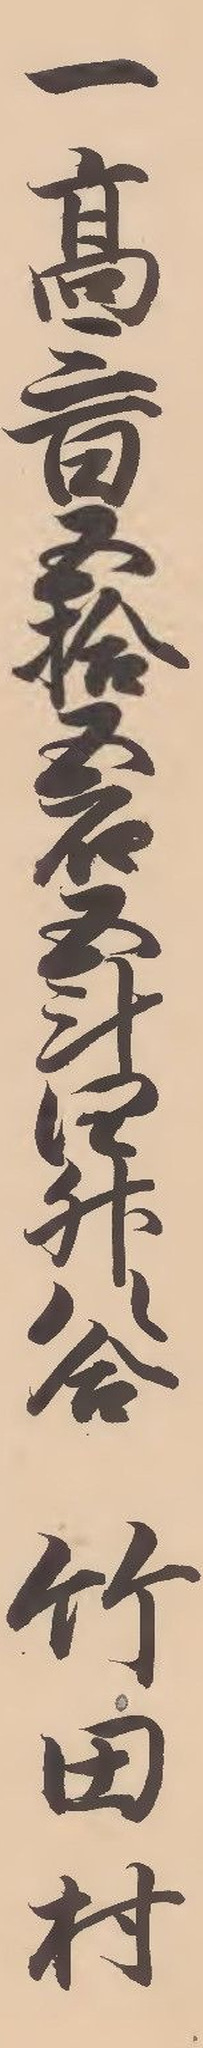一高三百五拾五石五斗四升八合竹田村
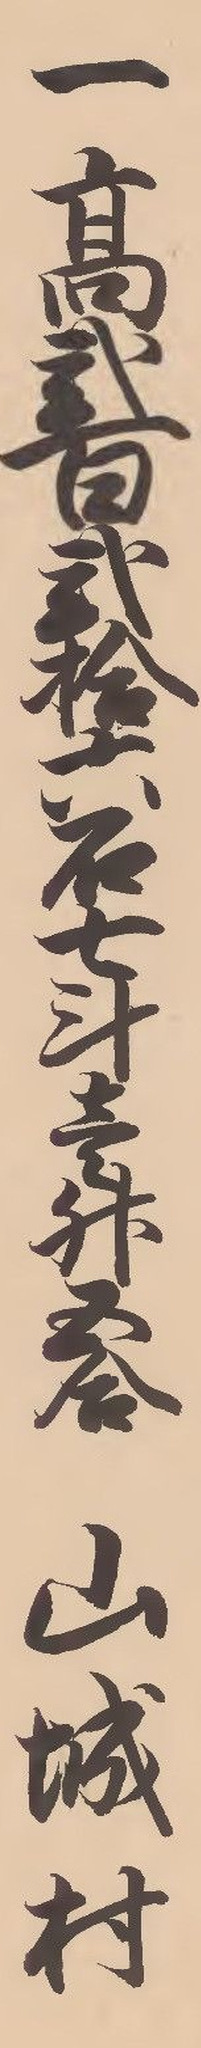一高弐百弐拾六石七斗壱升五合山城村
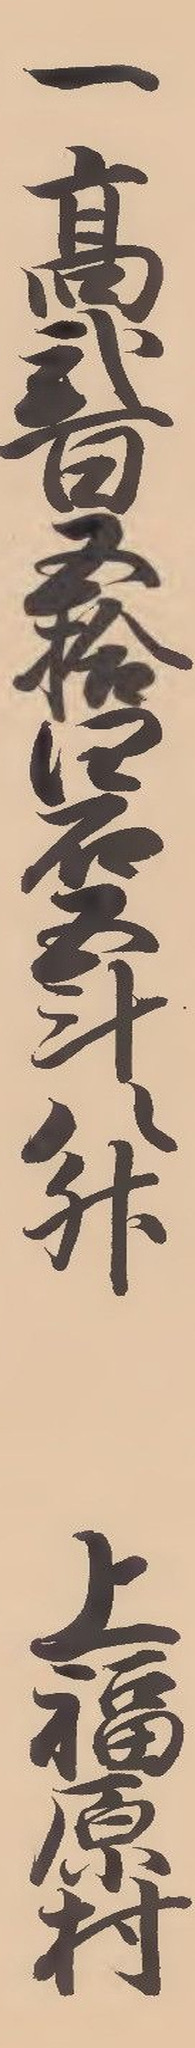一高弐百五拾四石五斗八升上福原村
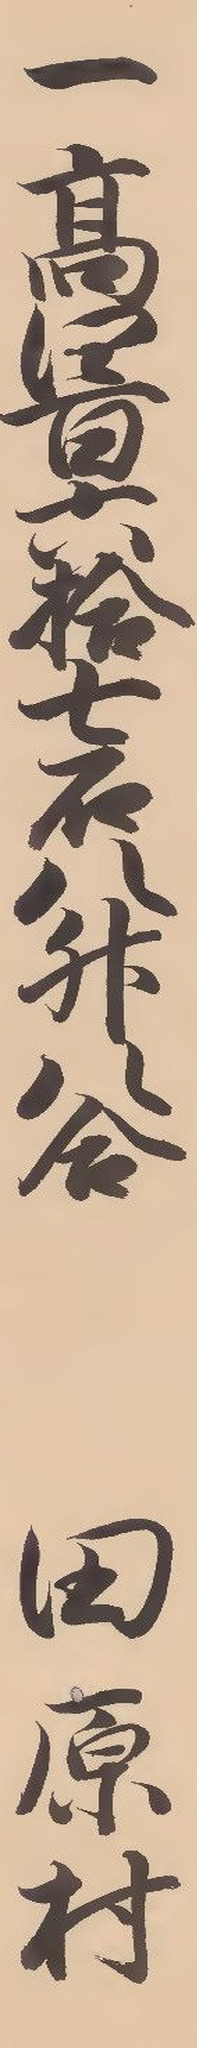一高四百六拾七石八升八合田原村
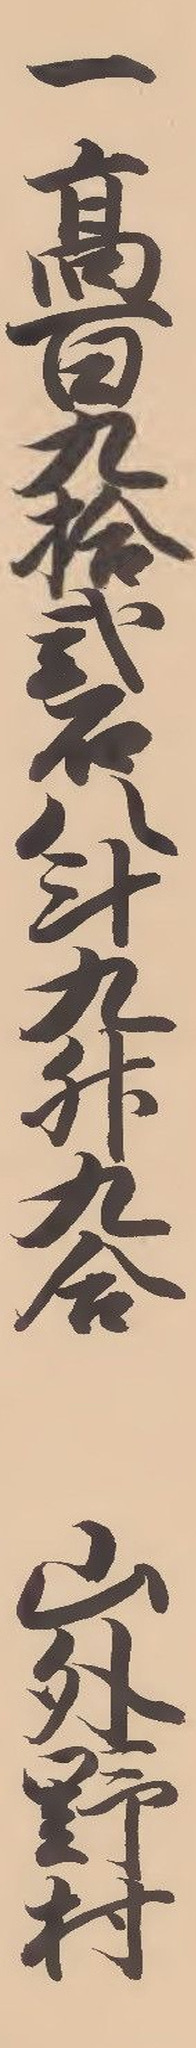一高百九拾弐石八斗九升九合山外野村
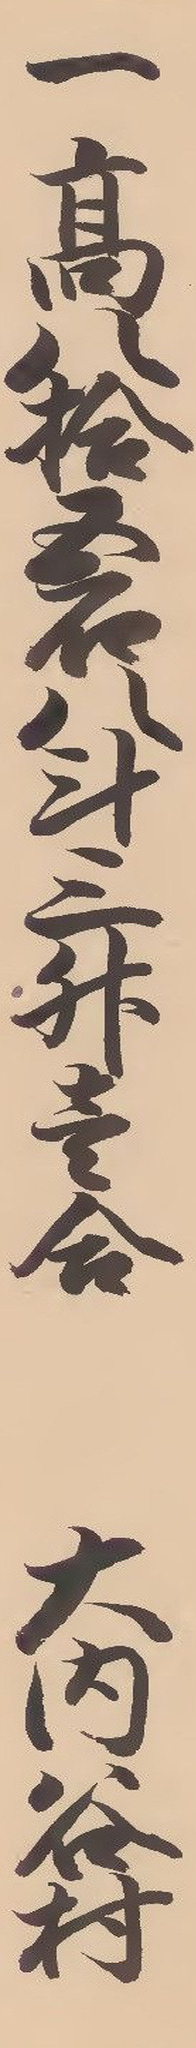一高八拾五石八斗三升壱合大内谷村

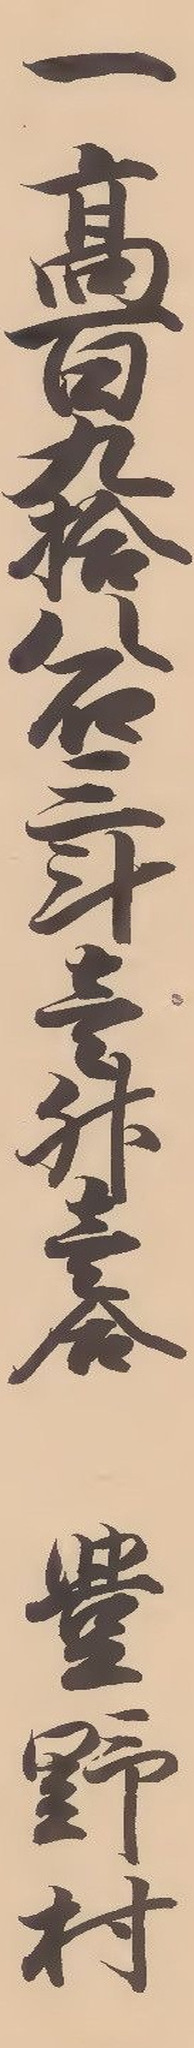一高百九拾八石三斗壱升壱合豊野村
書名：美作国郷帳
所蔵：国立公文書館 National Archives of Japan
